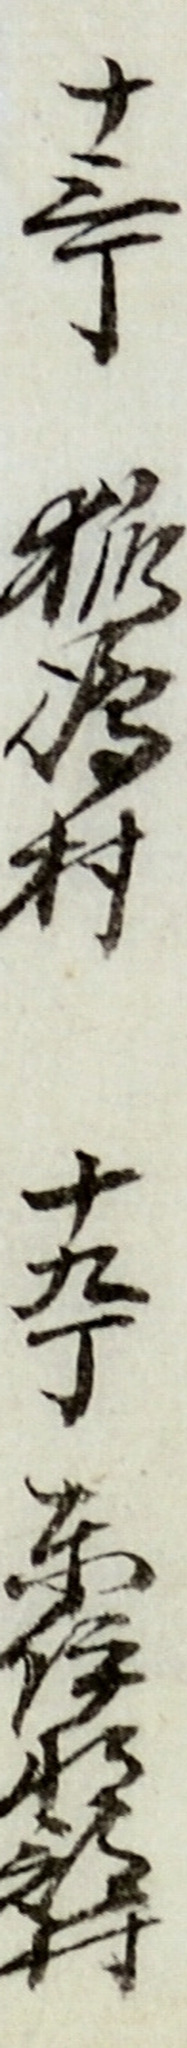十三丁狐島村十九丁東伊那部村
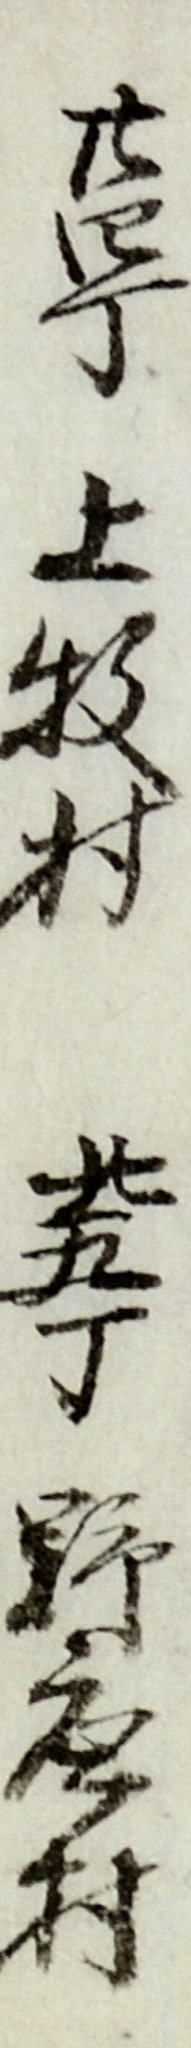廿四丁上牧村廿五丁野底村
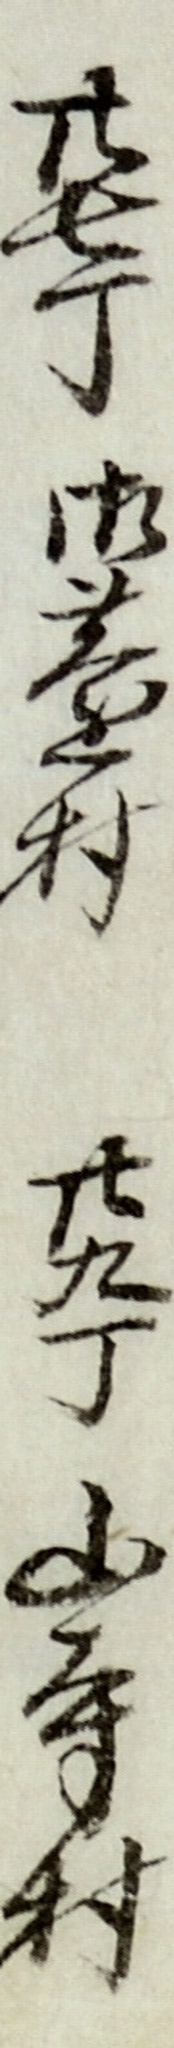廿七丁御薗村廿九丁山寺村
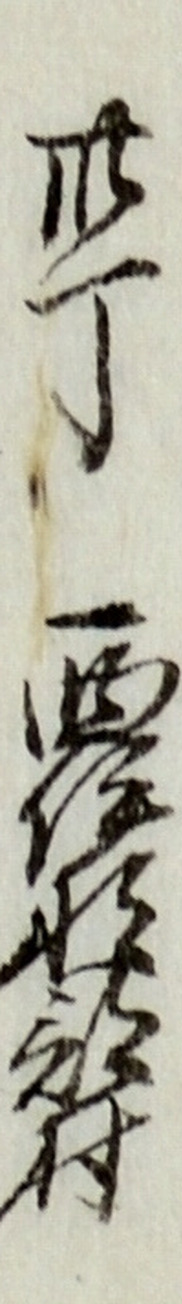卅丁西伊那部村

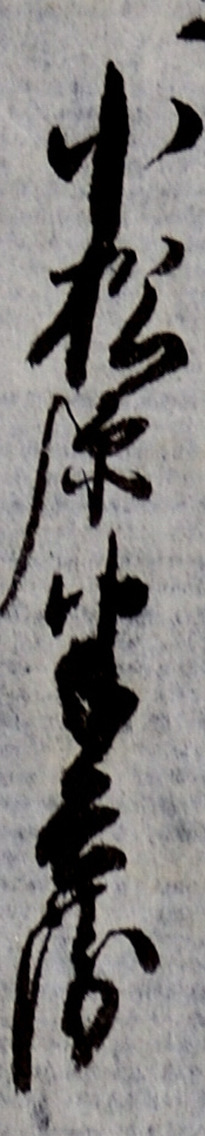小松原半兵衛
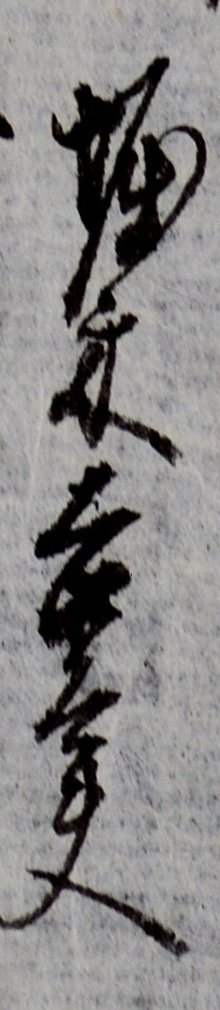堀米吉太夫
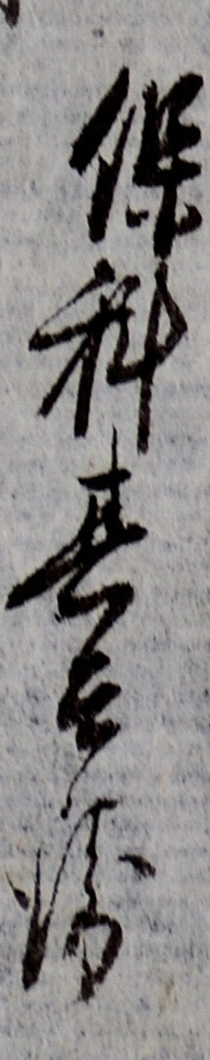保科其兵衛
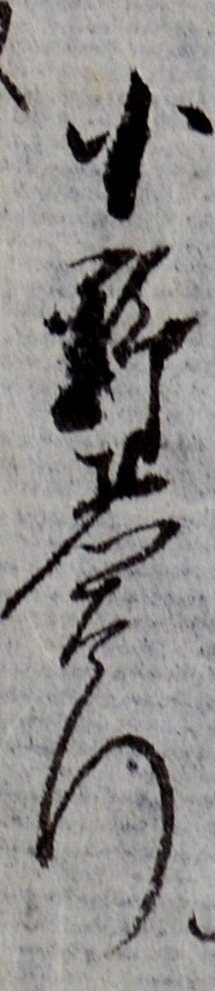小野惣右衛門
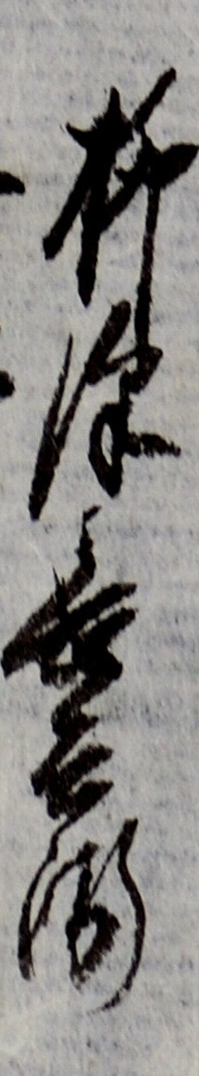柳沢長兵衛
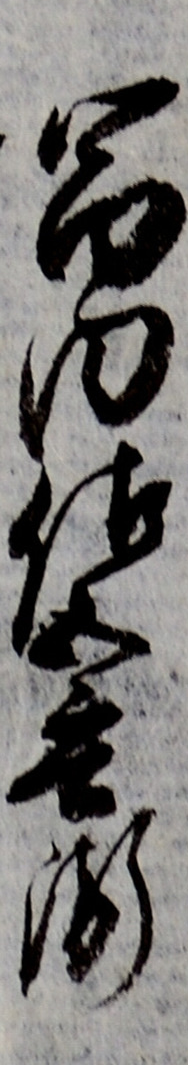富田佐五兵衛
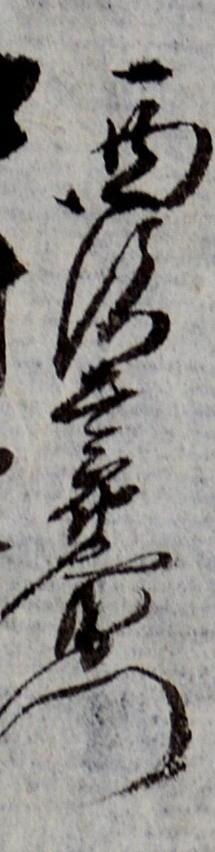西沢太郎右衛門
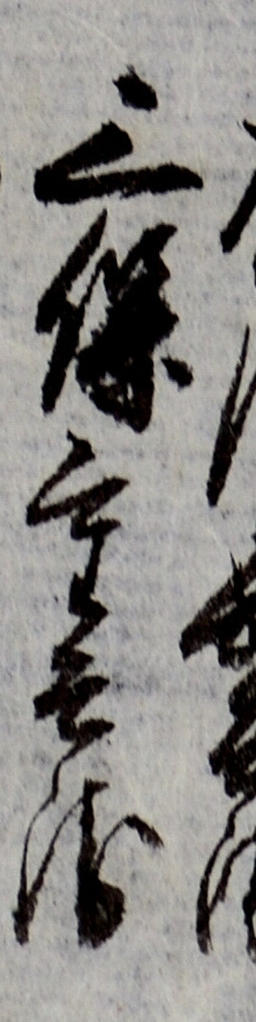三保重兵衛
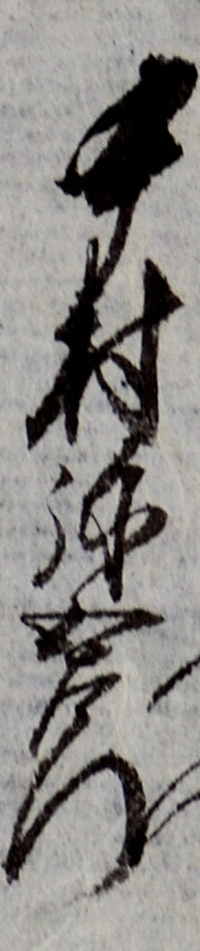中村弥右衛門
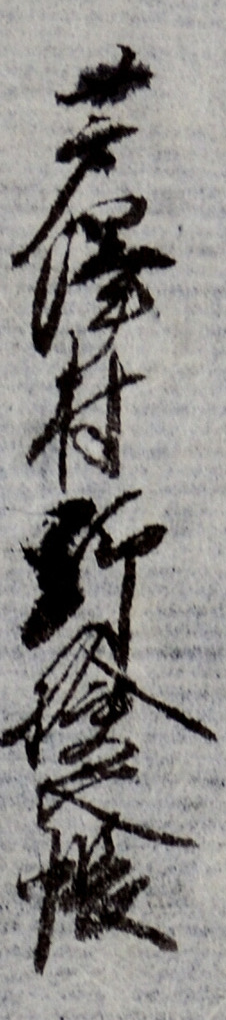芦沢村野検地帳

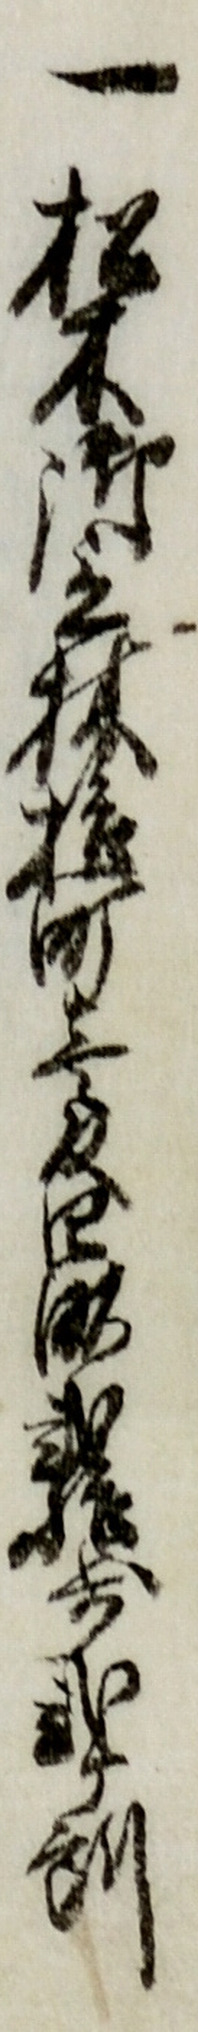一松木御立林拾町壱反四畝弐拾歩弐ヶ所
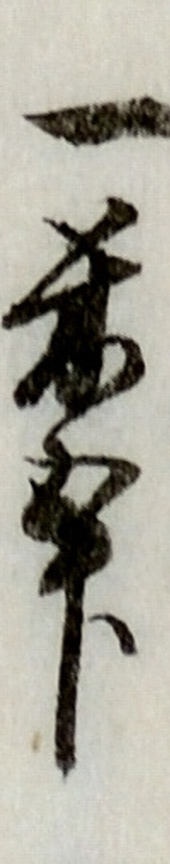一米五升
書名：御領分中山林社地手控
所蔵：伊那市立高遠町図書館・合同会社AMANE
